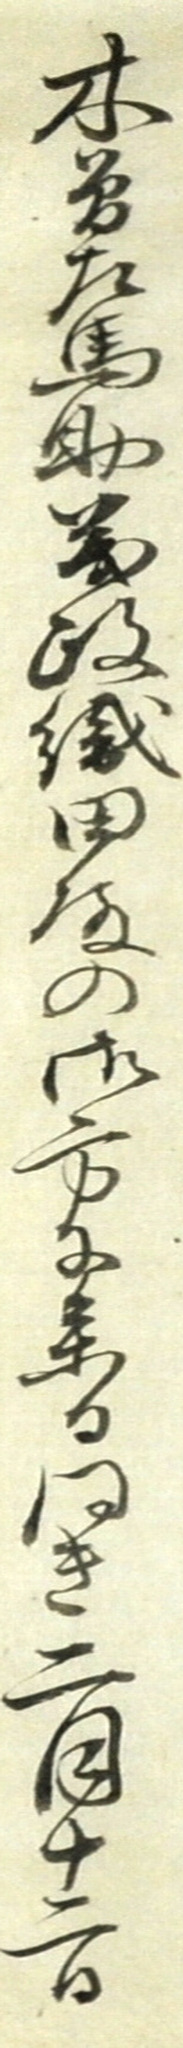木曽左馬助義政織田殿の御方に参る同き二月十二日
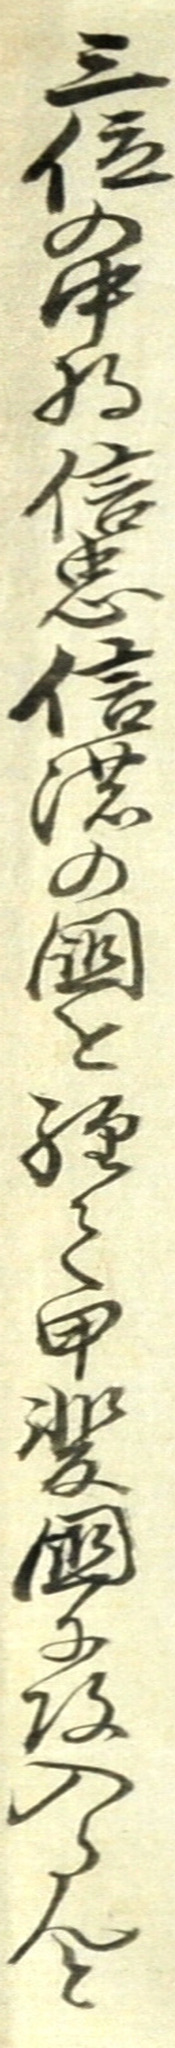三位の中将信忠信濃の国を経て甲斐国に攻入らんと

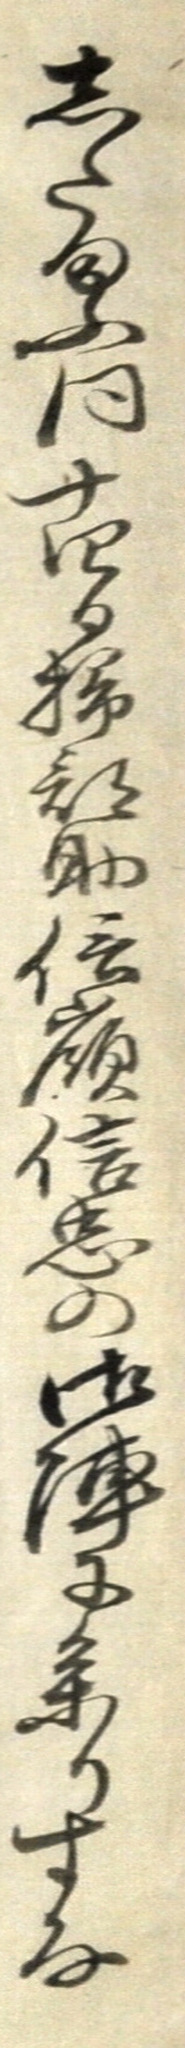したまふ同十四日掃部助信嶺信忠の御陣に参りすな
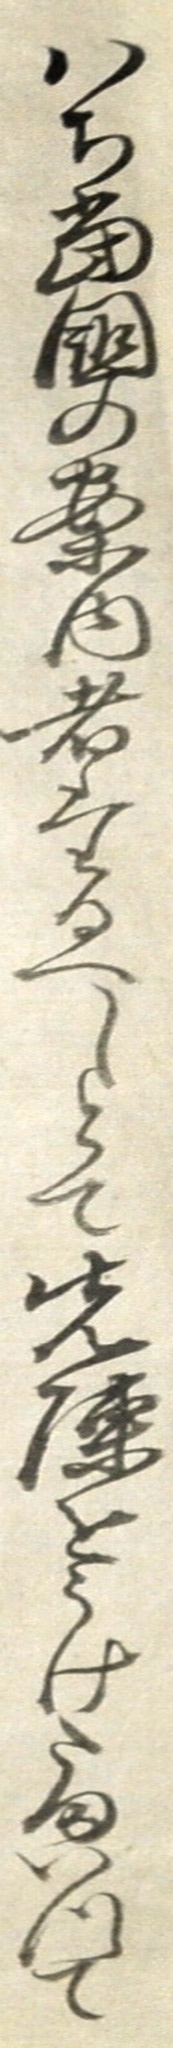はち当国の案内者たるへしとて先陣をうけたまはつて
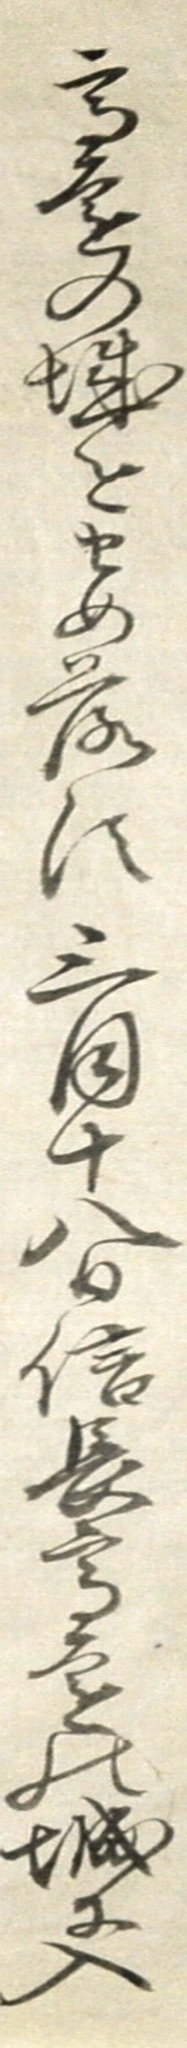高遠の城をせめ落す三月十八日信長高遠の城に入
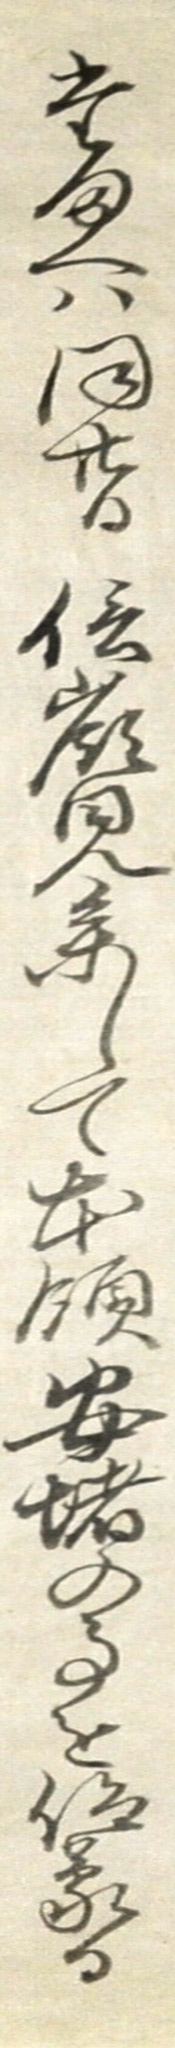たまへは同廿日信嶺見参して本領安堵の事を仰蒙る
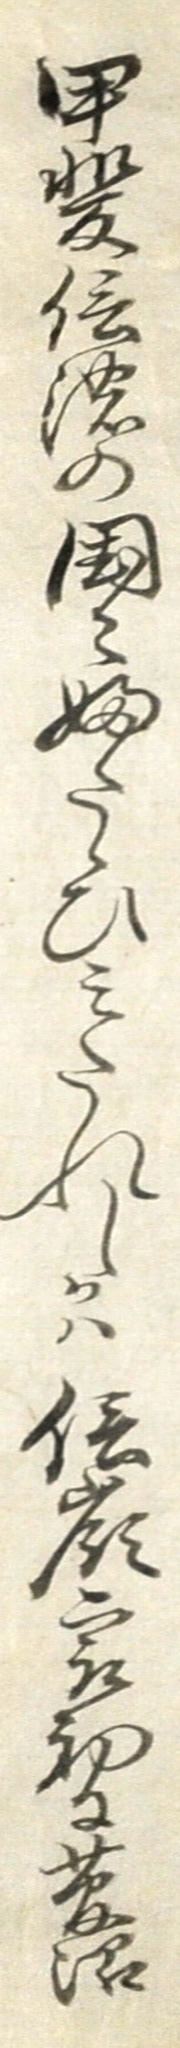甲斐信濃の国々ふたゝひみたれしかは信嶺最初に菅沼
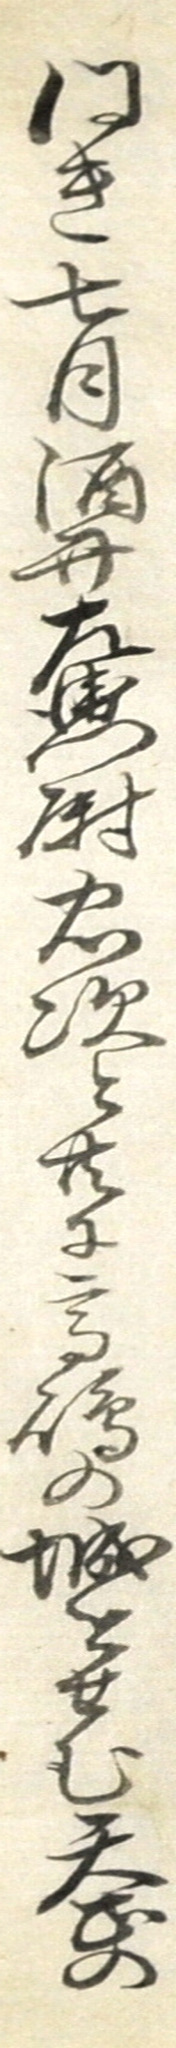同き七月酒井左衛門尉忠次と共に高島の城をせむ天正の
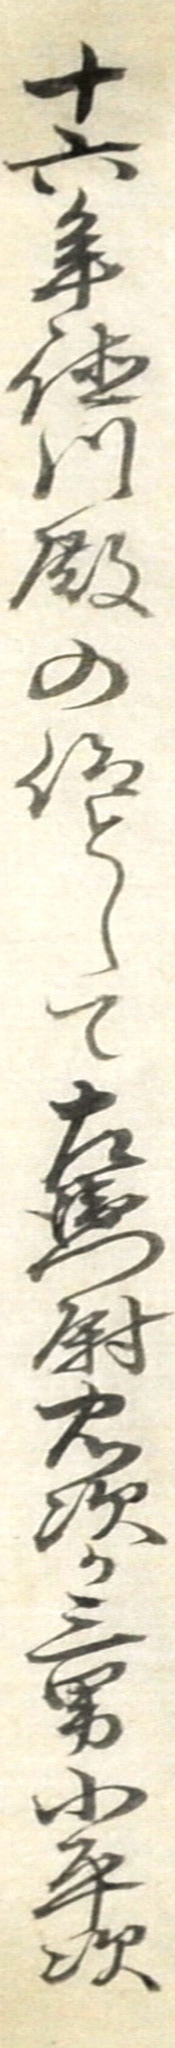十六年徳川殿の仰として左衛門尉忠次か三男小平次
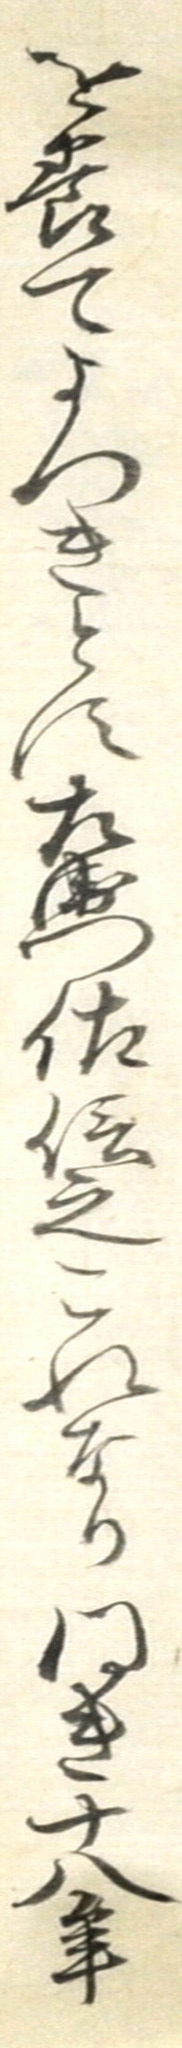を養てよつきとす左衛門佐信之これなり同き十八年
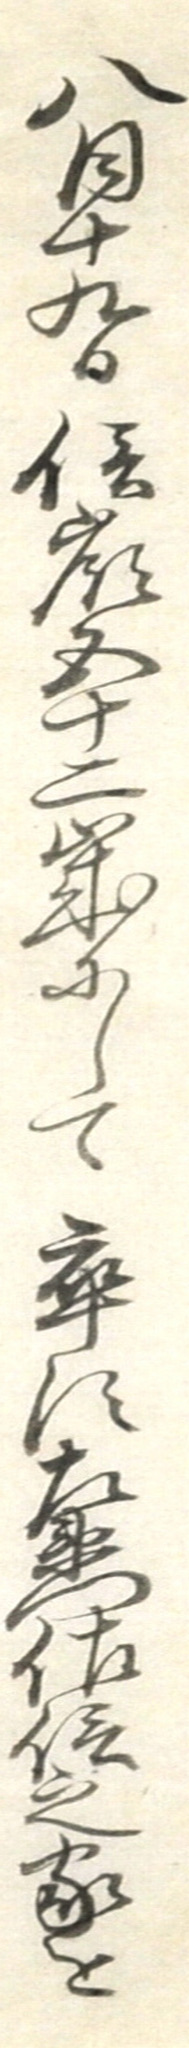八月十九日信嶺五十二歳にして卒す左衛門佐信之家を
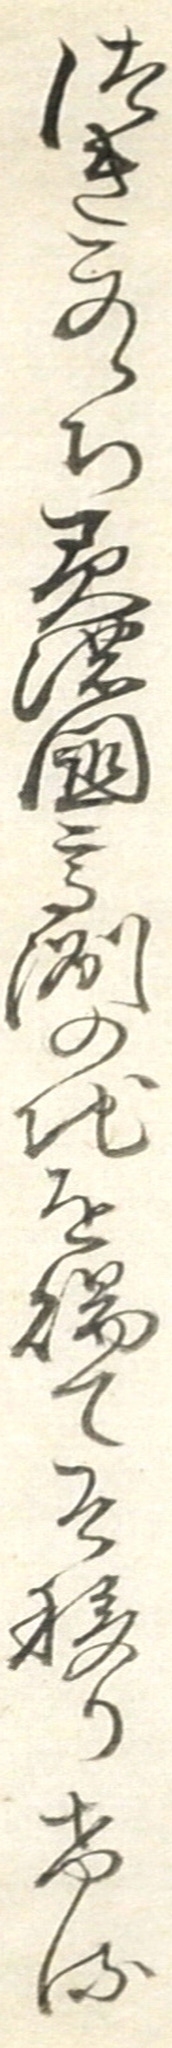つきこのゝち美濃国高洲の地を賜てそ移りける
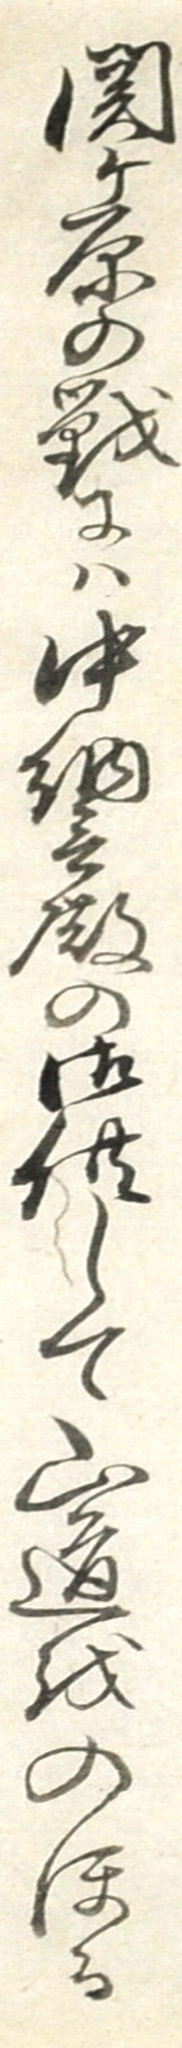関ヶ原の戦には中納言殿の御供して山道をのほる
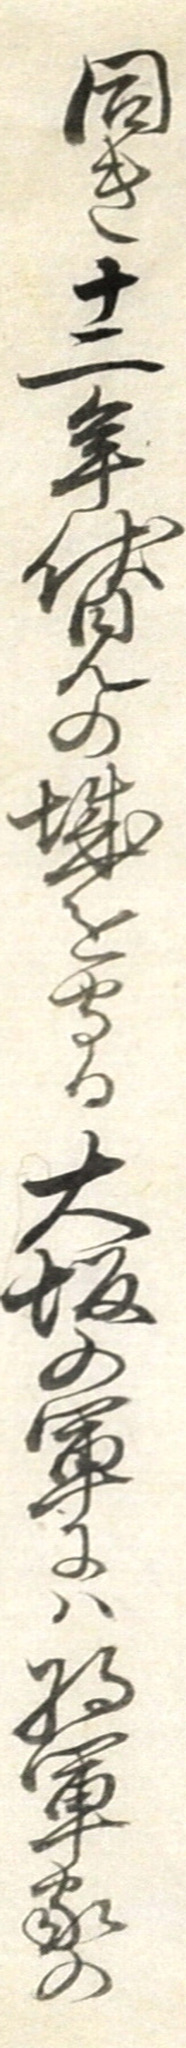同き十二年伏見の城を守る大坂の軍には将軍家の
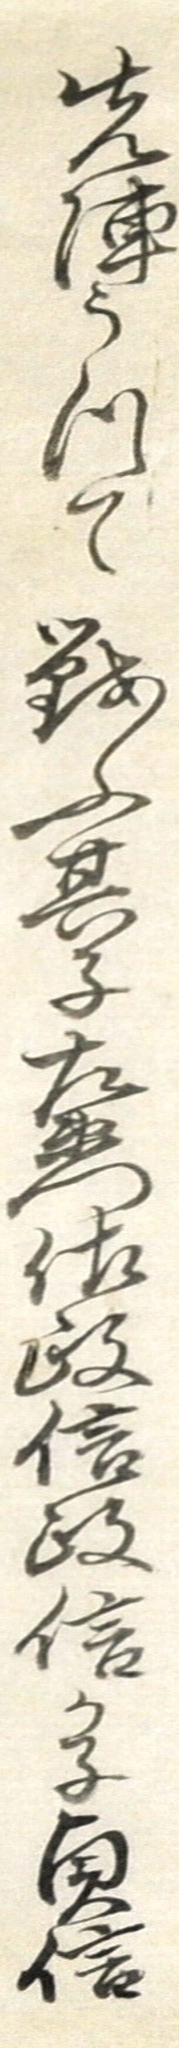先陣うつて戦ふ其子左衛門佐政信政信か子貞信

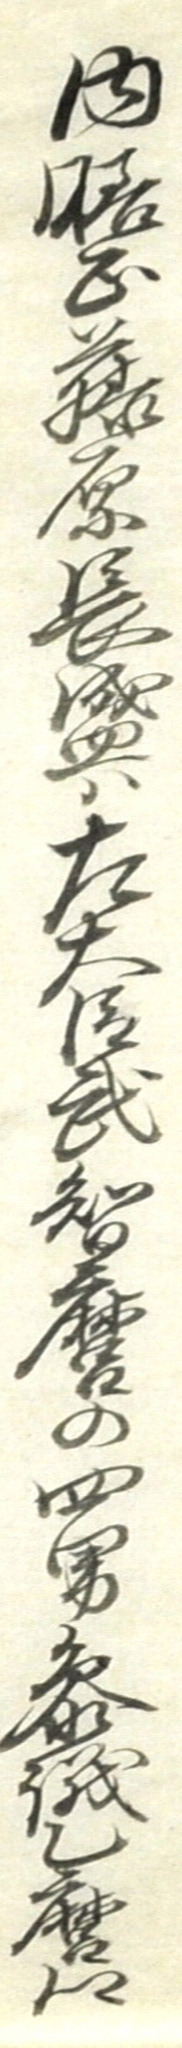内膳正藤原長盛は左大臣武智麿の四男参議乙麿卿
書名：藩翰譜（六）
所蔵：伊那市立高遠町図書館・合同会社AMANE
